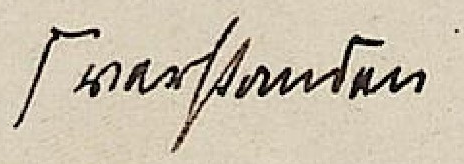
[ verstanden
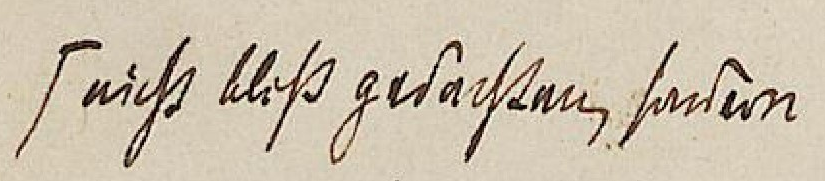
[ nicht bloß gedachten, sondern
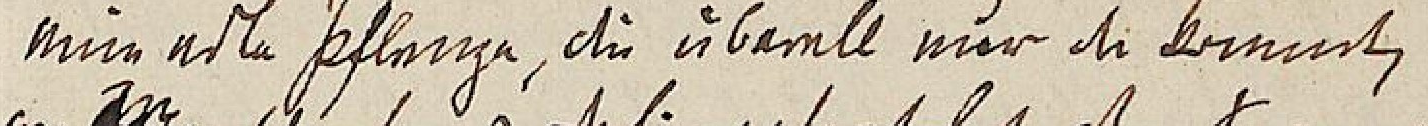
eine edle Pflanze, die überall nur da kommt,
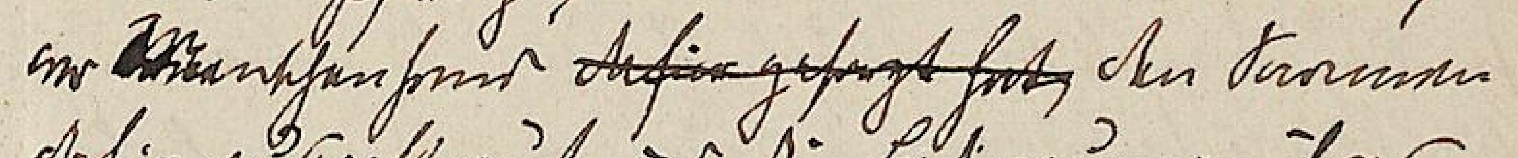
wo Menschenhand dafür gesort hat, den Saamen
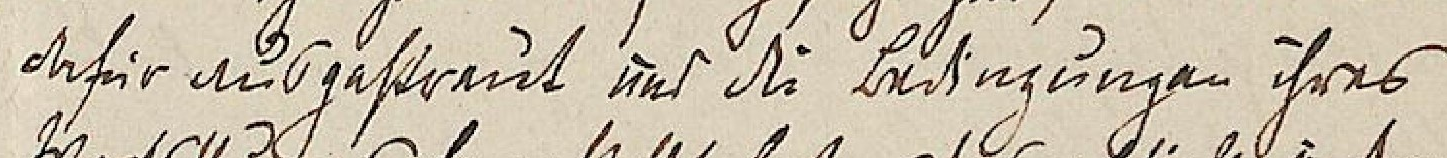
dafür ausgestreut und die Bedingungen ihres
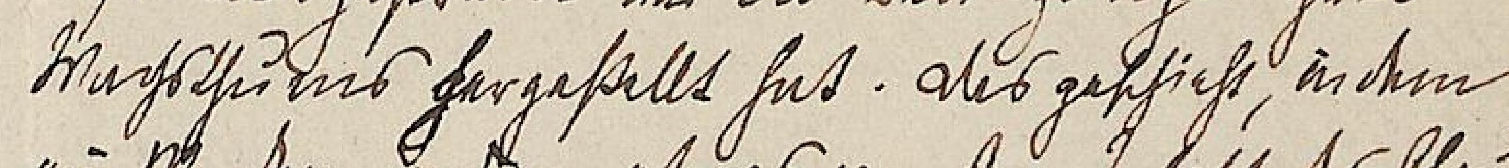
Wachsthums hergestellt hat. Das geschieht, indem
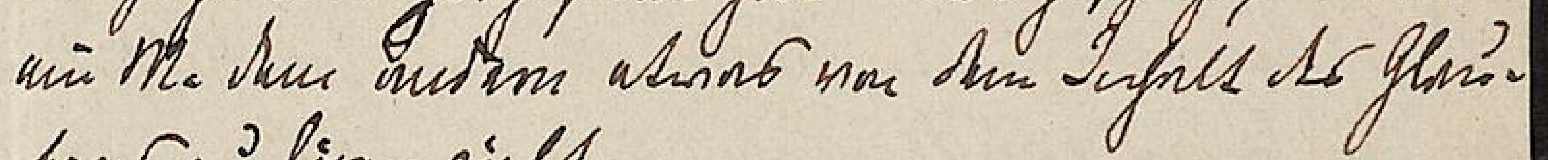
ein M. dem anderen etwas von dem Inhalt des Glau¬
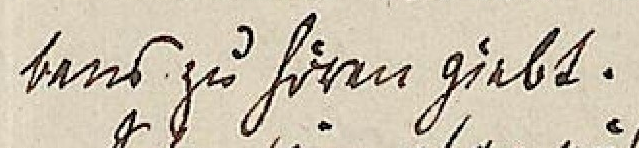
bens zu hören giebt.
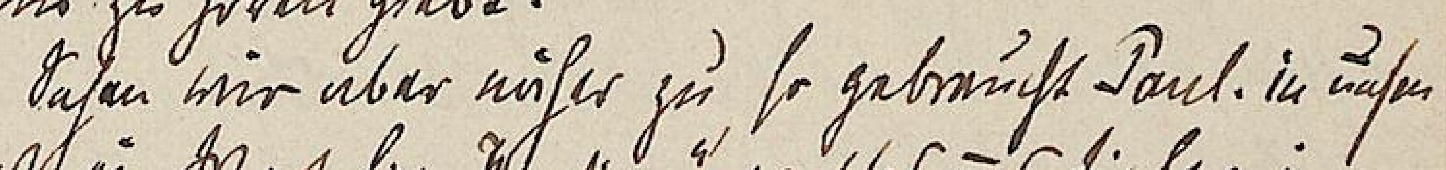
Sehen wir aber näher zu so gebraucht Paul. in unsm
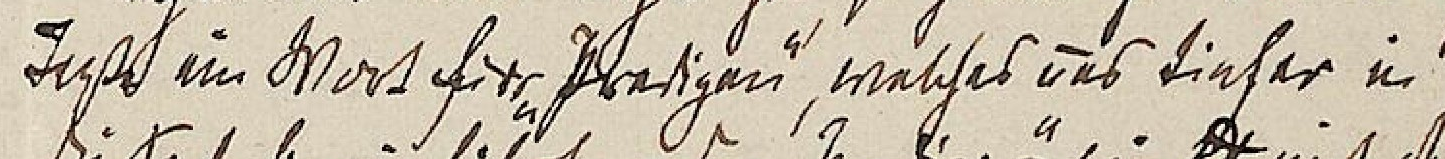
Texte ein Wort für "Predigen", welches uns tiefer in
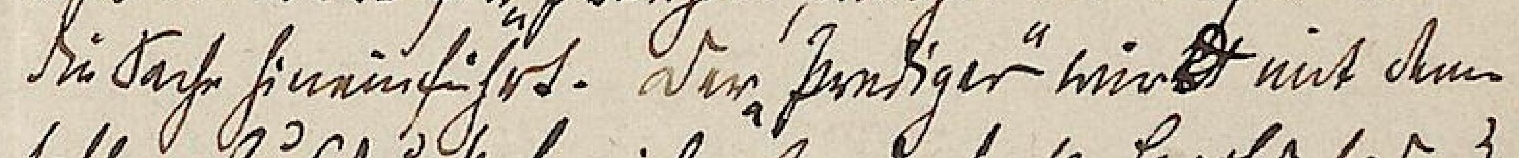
die Sache hineinführt. Der "Prediger" wird mit dem
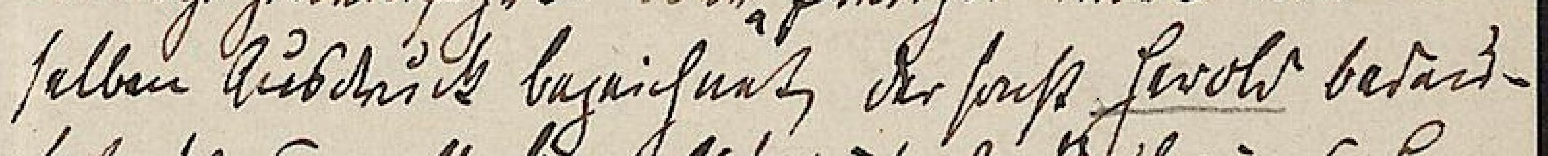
selben Ausdruck bezeichnet, der sonst Herold bedeu¬
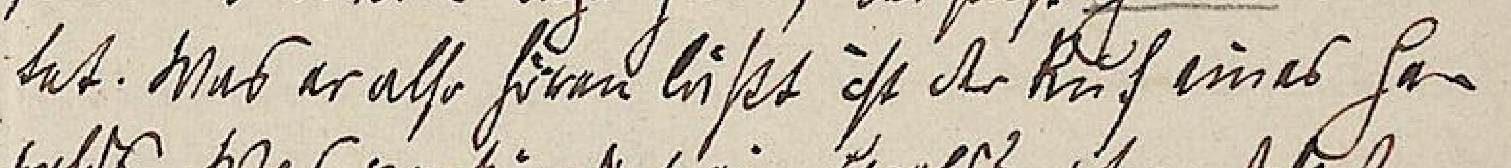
tet. Was er also hören läßt ist der Ruf eines He¬
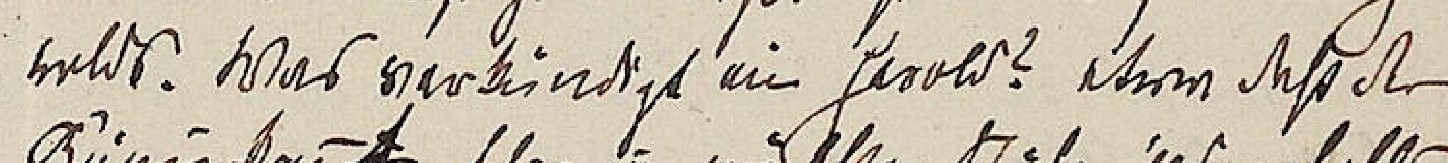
rolds. Was verkündigt ein Herold? etwa daß der
